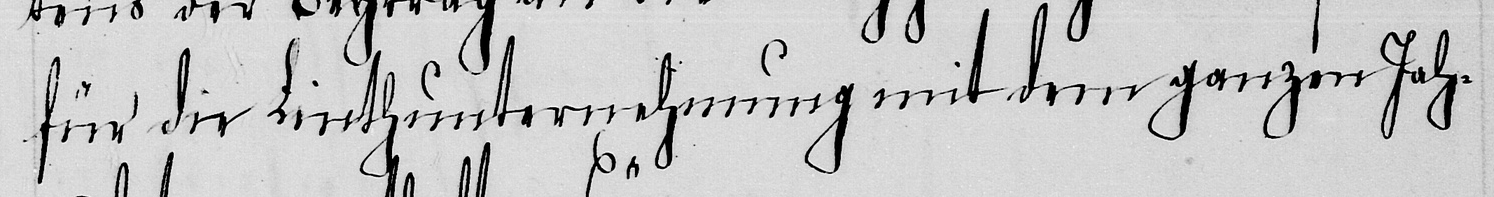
für die Linthunternehmung mit dem ganzen Jah¬
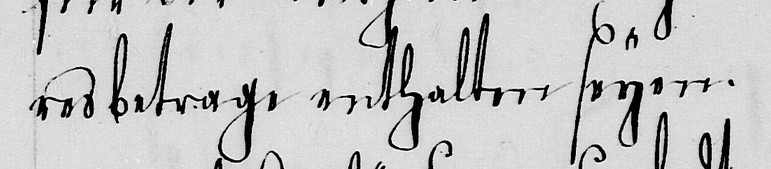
resbetrage enthalten seyen.
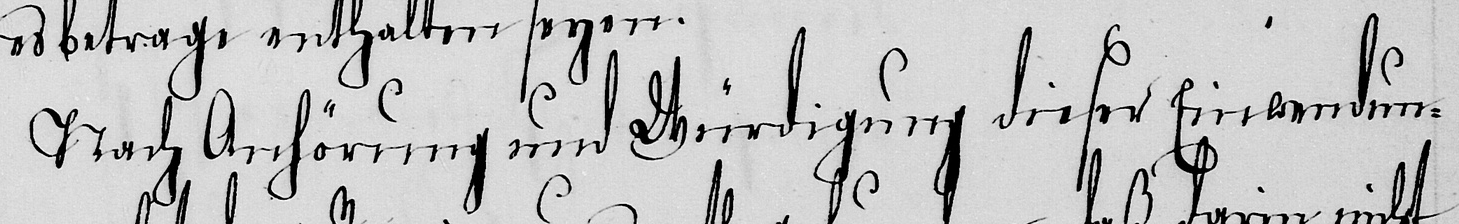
Nach Anhörung und Würdigung dieser Einwendun¬
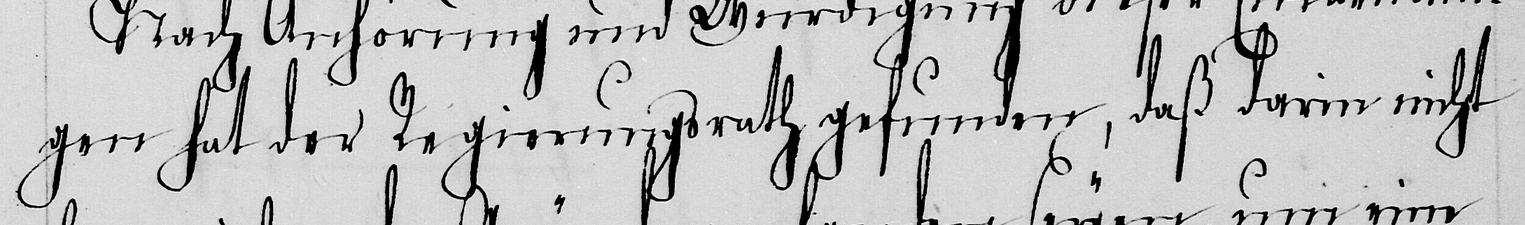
gen hat der Regierungsrath gefunden, daß darin nicht
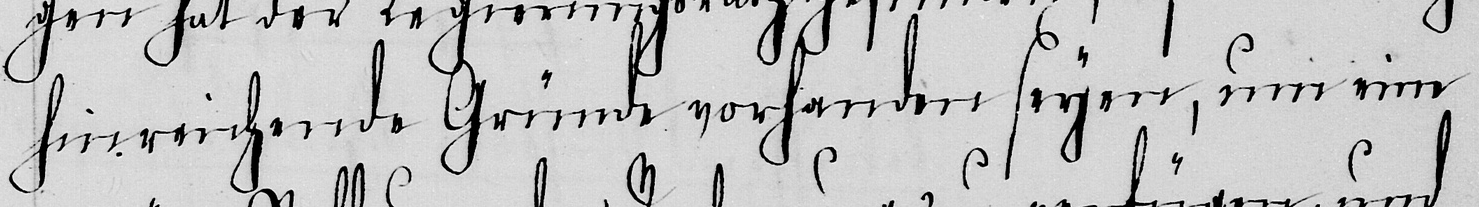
hinreichende Gründe vorhanden seyen, um eine
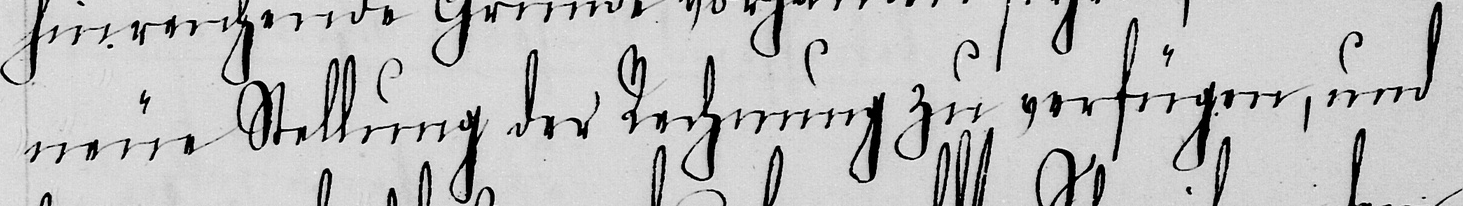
neue Stellung der Rechnung zu verfügen, und
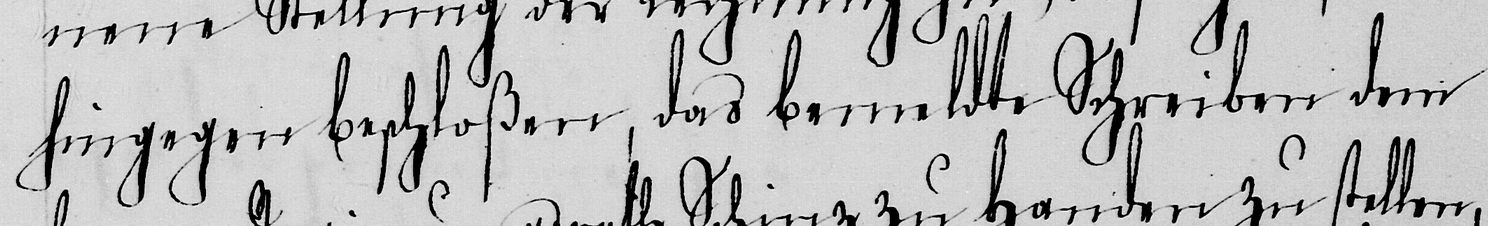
hingegen beschloßen, das bemeldte Schreiben dem
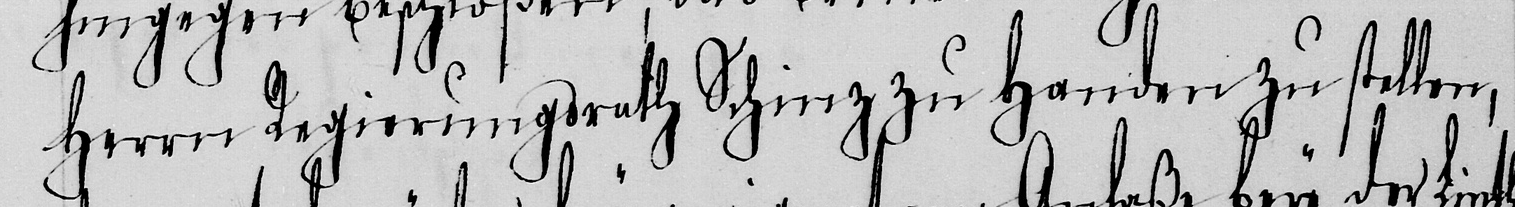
Herrn Regierungsrath Schinz zu Handen zu stellen,
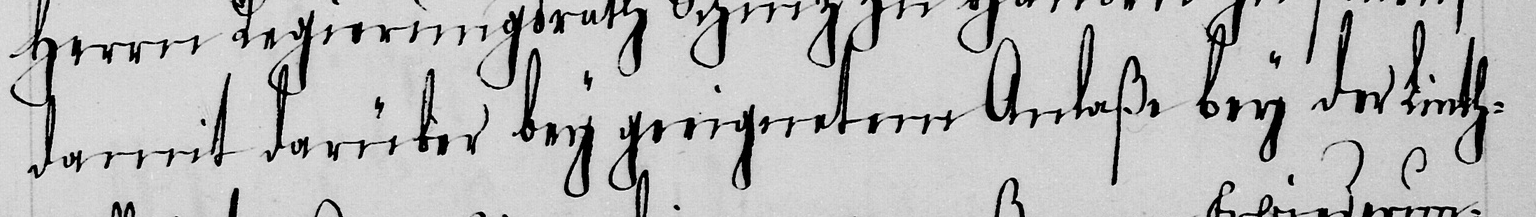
damit darüber bey geeignetem Anlaße bey der Linth¬
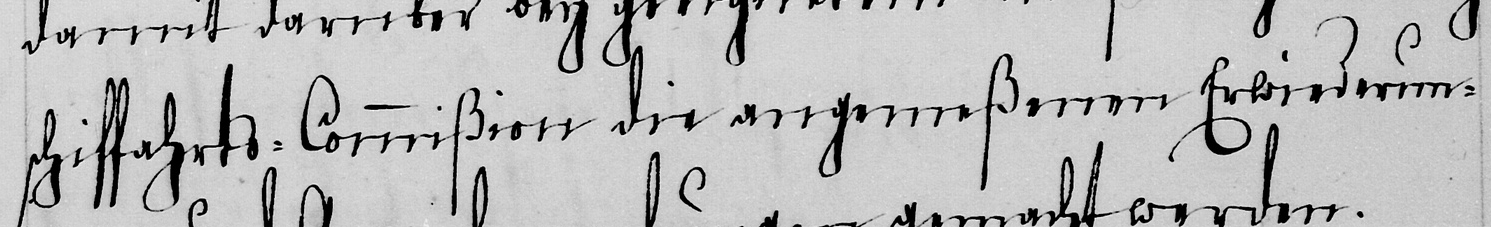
schiffahrts-Commißion die angemeßenen Erwiederun¬
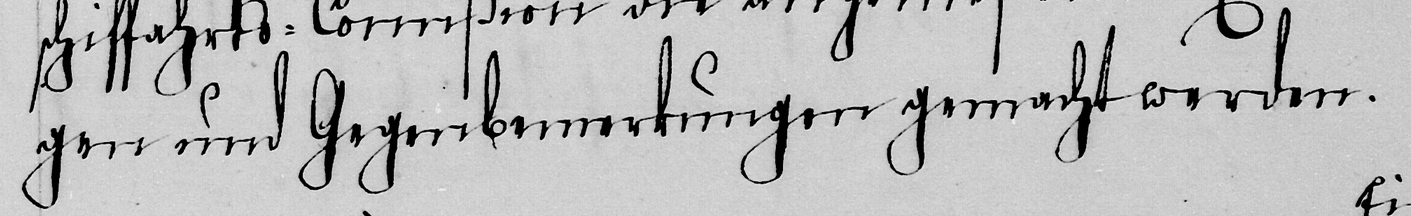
gen und Gegenbemerkungen gemacht werden.
